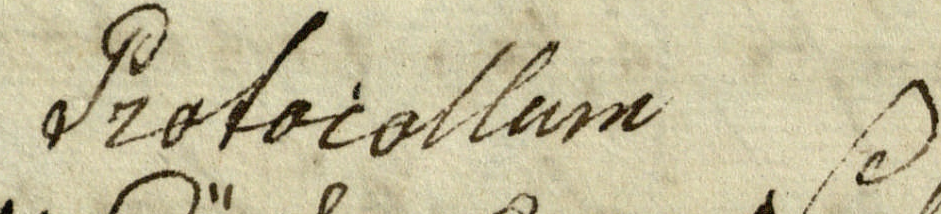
Protocollum
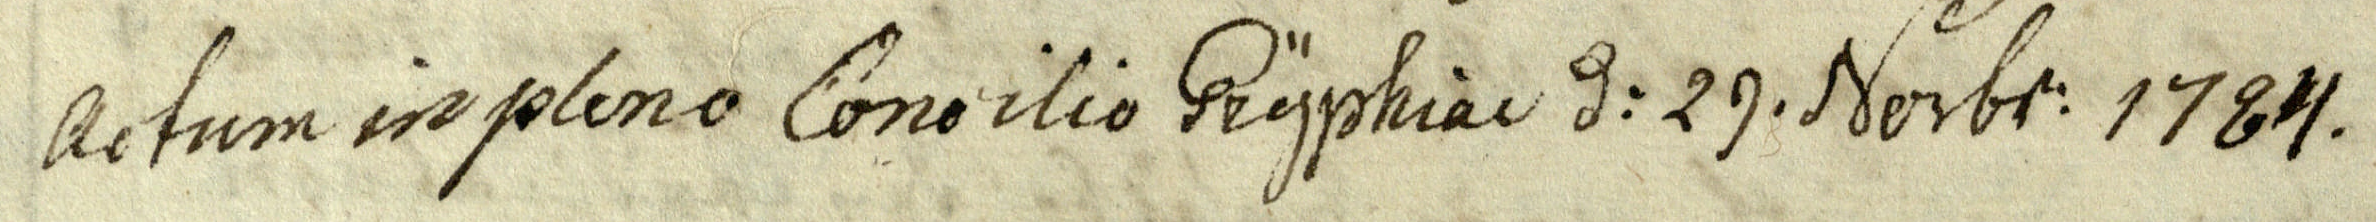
Actum in pleno Concilio Gryphiae d. 29. Novbr. 1784
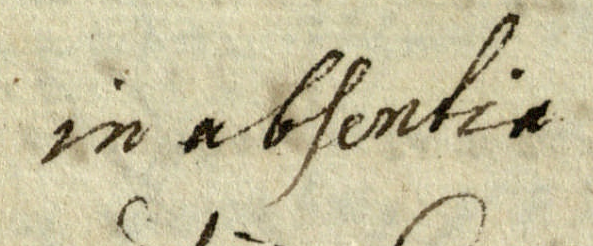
in absentia
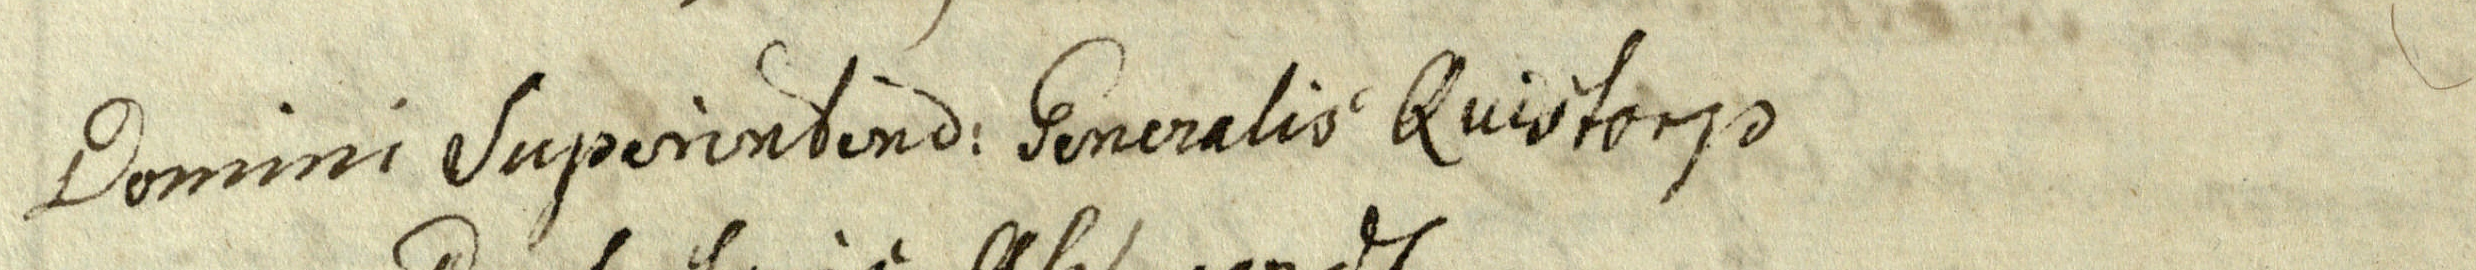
Domini Superintend. Generalis Quistorp
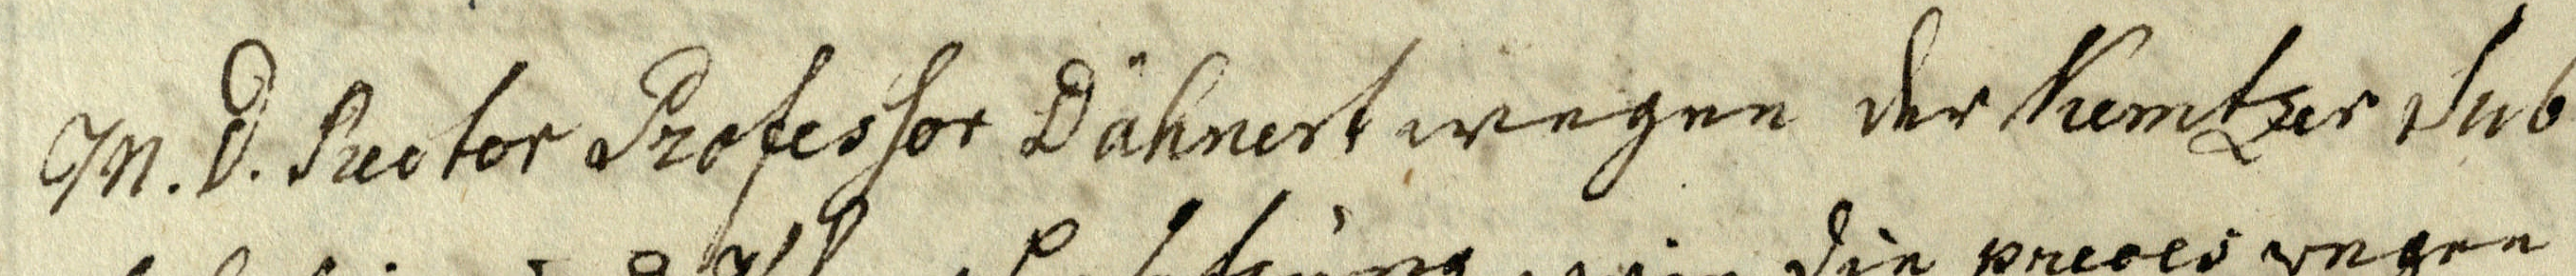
1, M. D. Rector Professor Dähnert wegen der Kemtzer Sub¬
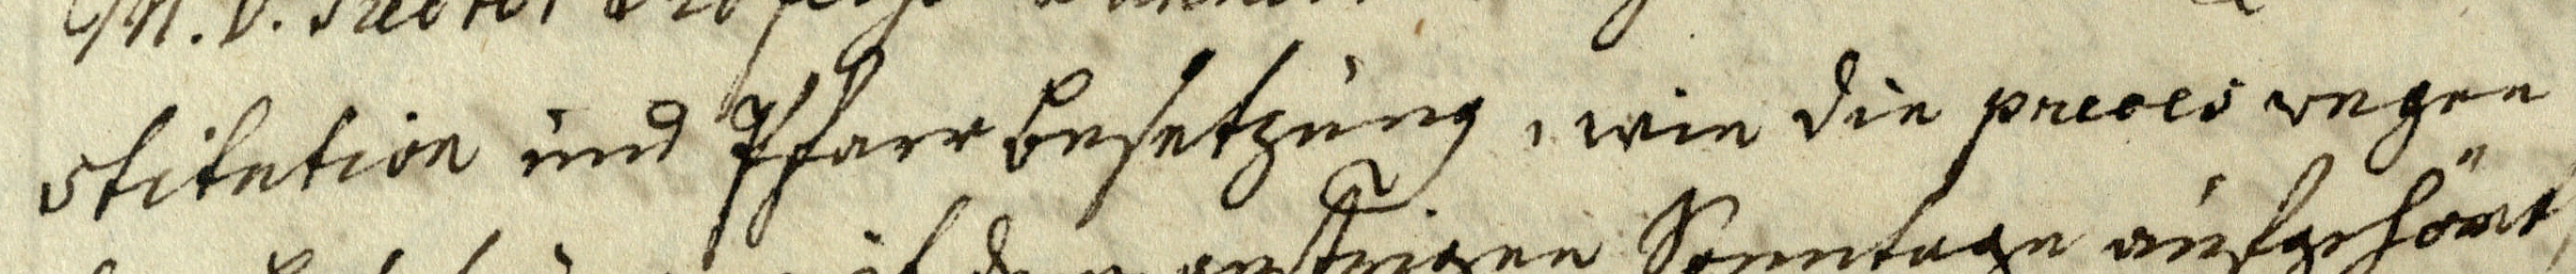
stitution und Pfarr Besetzung, wie die preces wegen
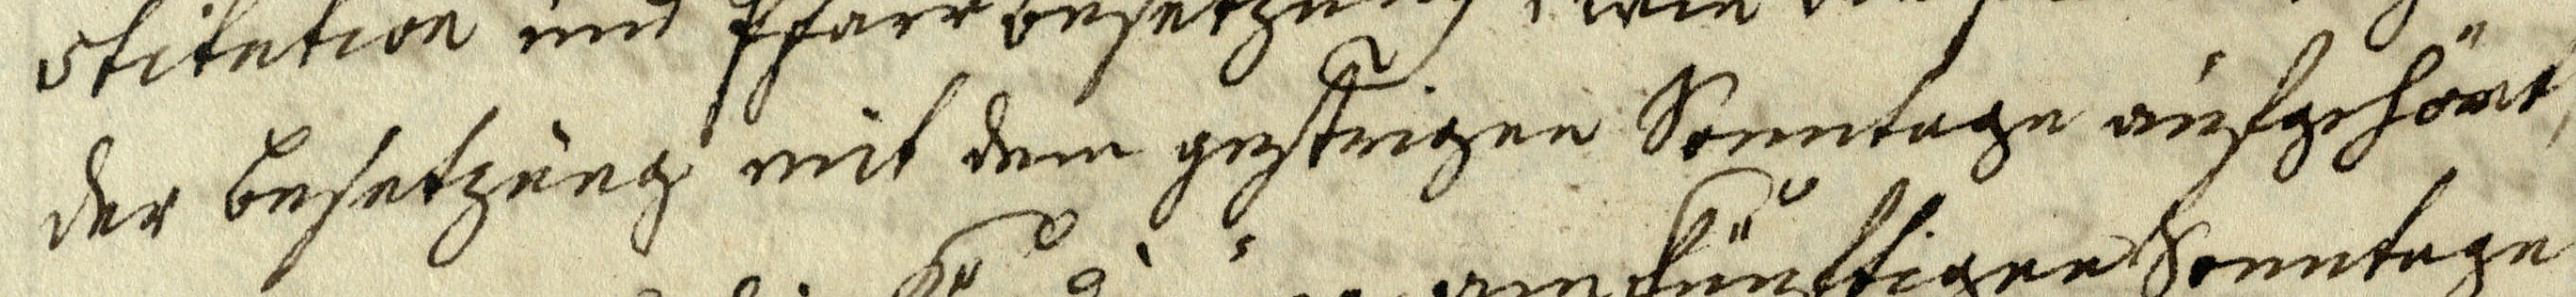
der Besetzung mit dem gestrigen Sonntage aufgehöret,
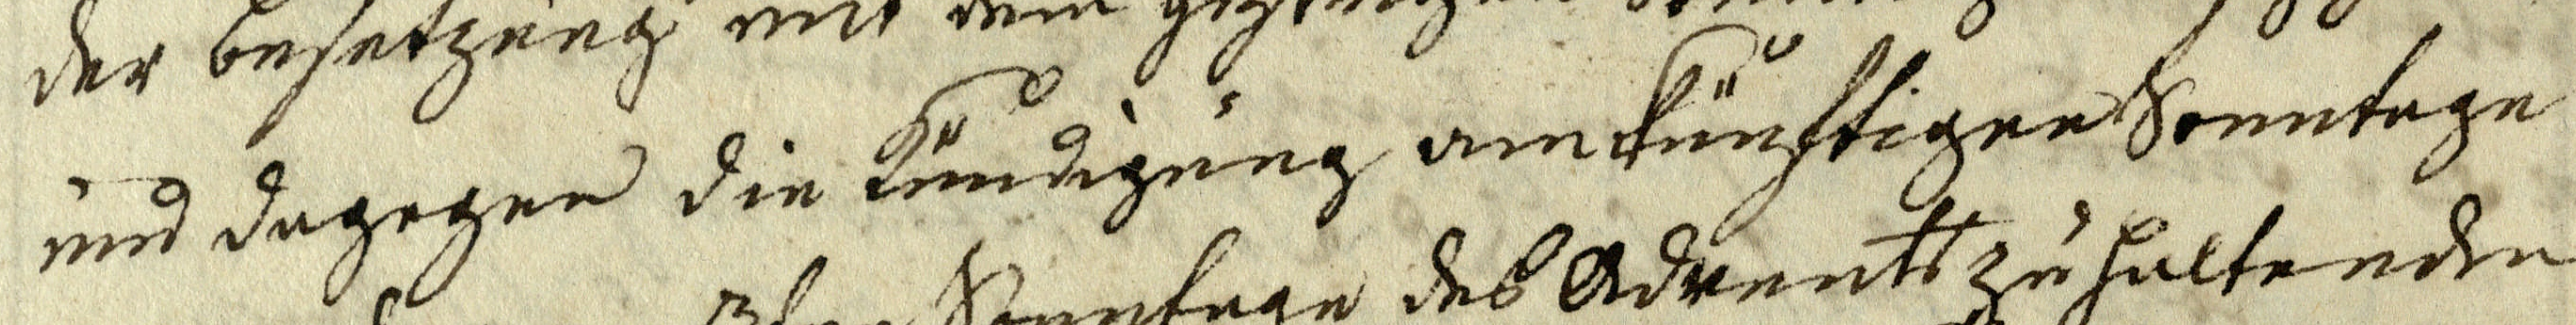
und dagegen die Kündigung am künftigen Sonntage
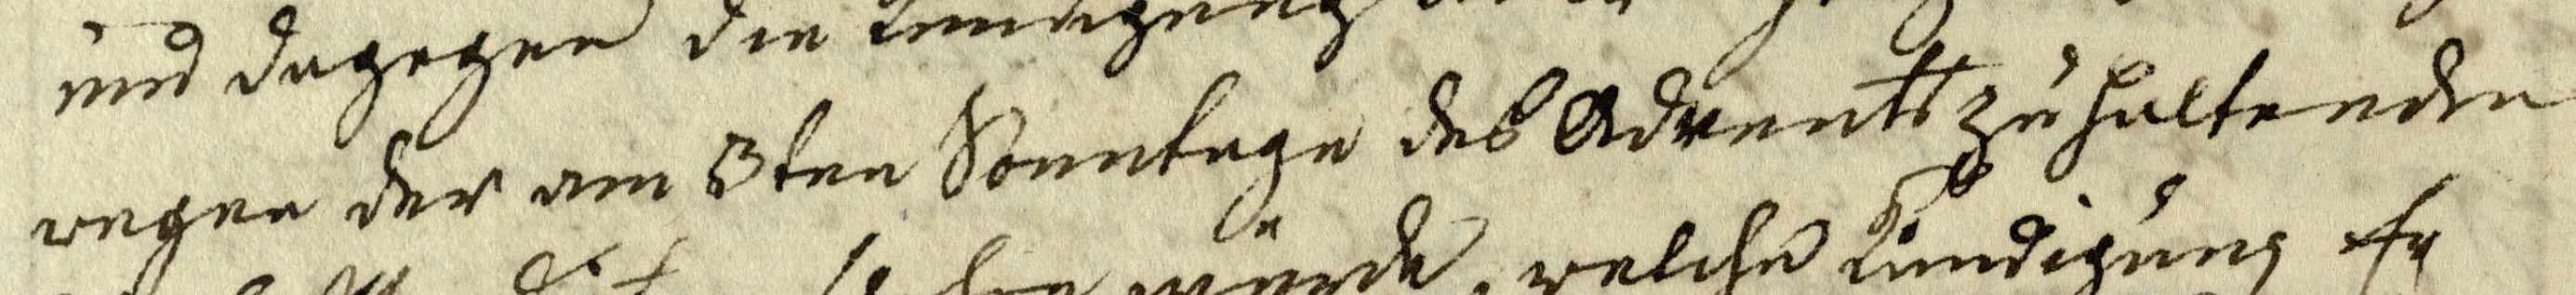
wegen der am 3ten Sonntage des Advents zu haltenden
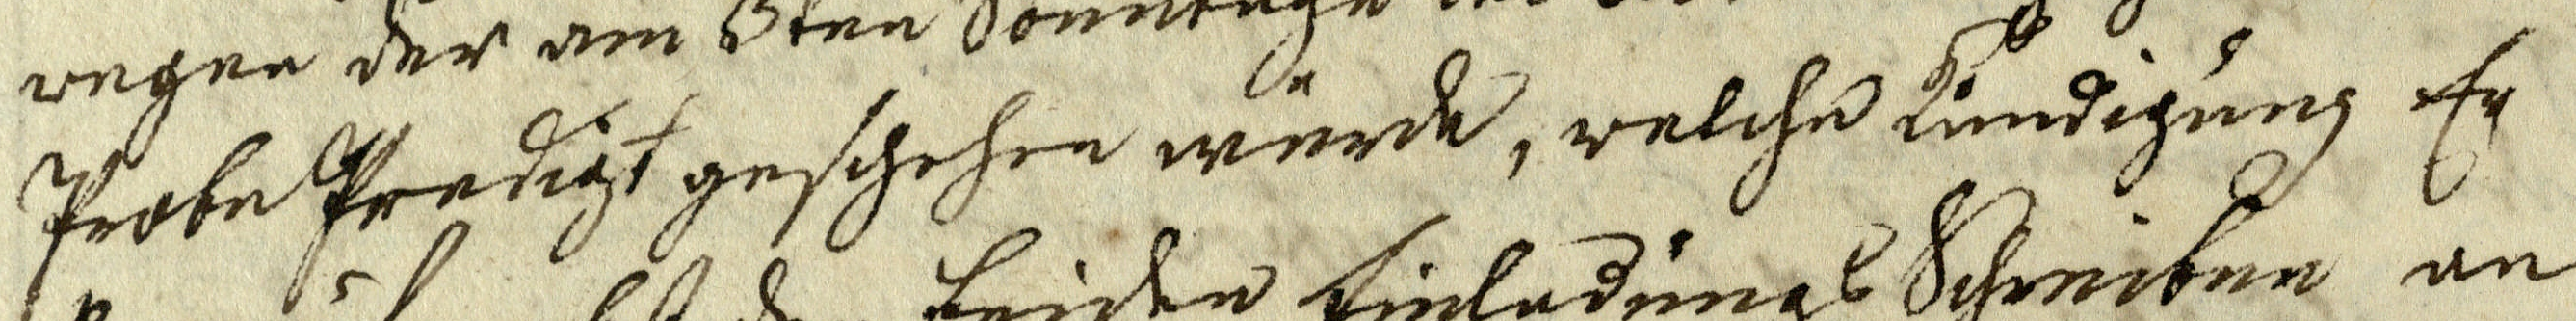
ProbePredigt geschehen würde, welche Kündigung Er
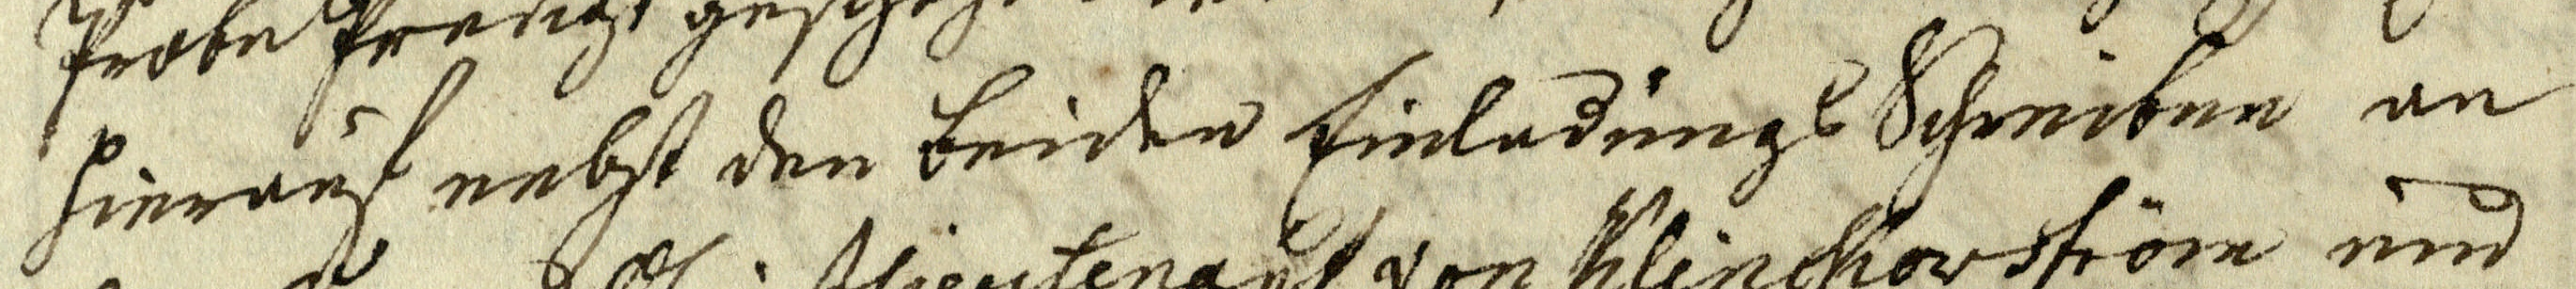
hierauf nebst den beiden Einladungsschreiben an
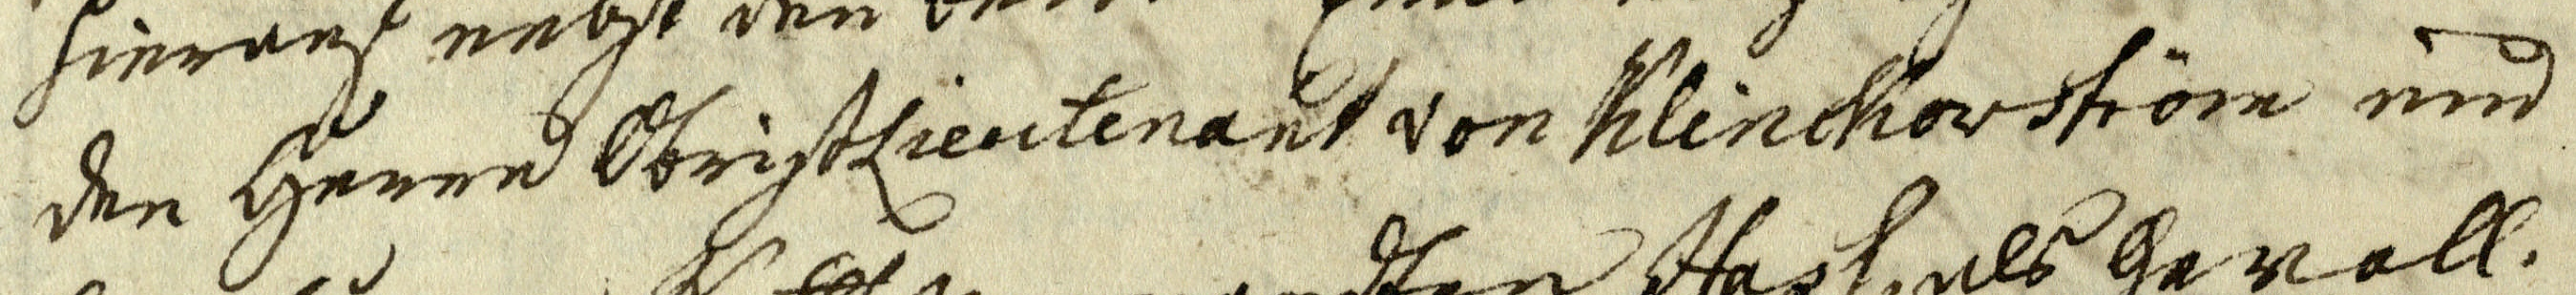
den Herrn ObristLieutenant von Klinckowström und
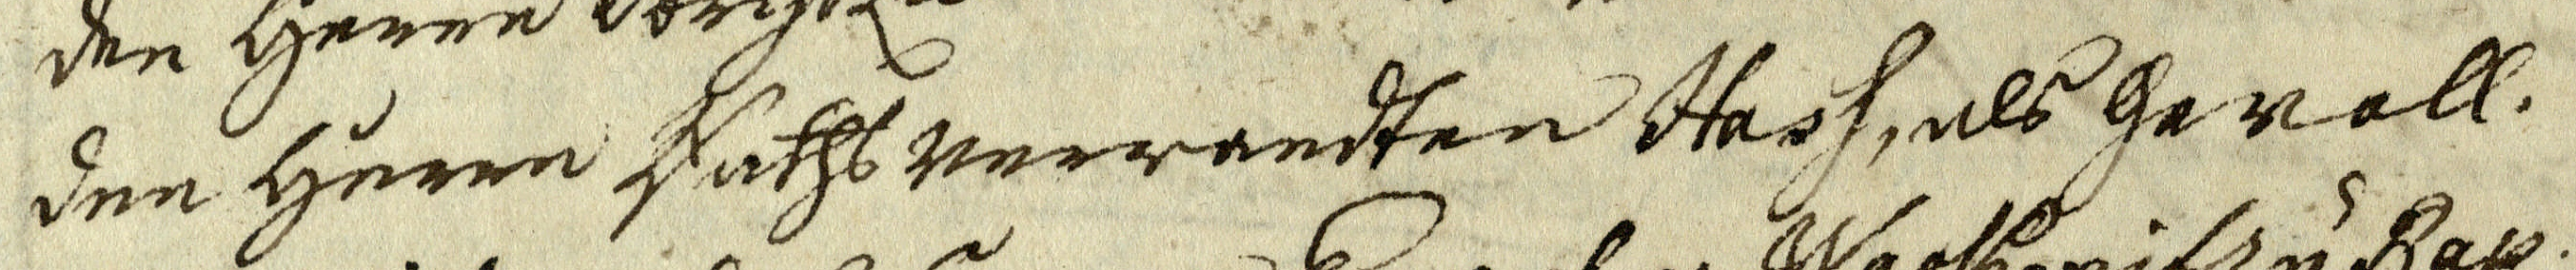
den Herrn Rathsverwandten Hass, als Gevoll¬
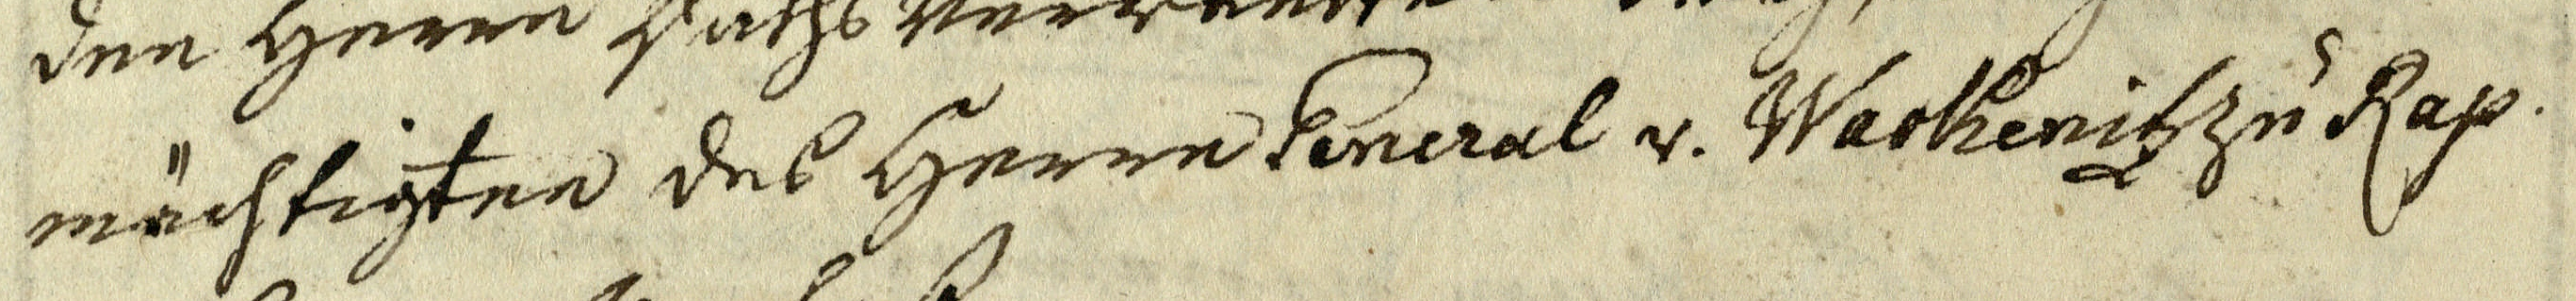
mächtigten des Herrn General v. Wackenitz zu Rap¬
